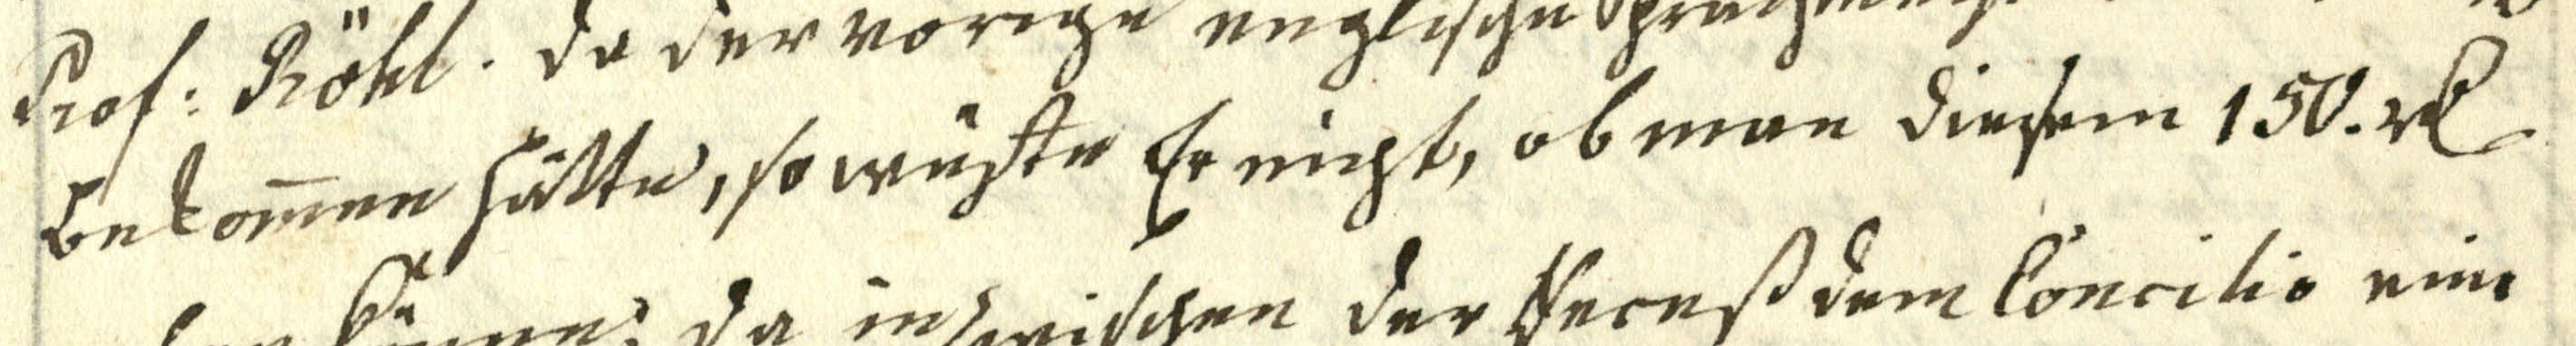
bekomen hätte, so wüste Er nicht, ob man diesem 150 r.
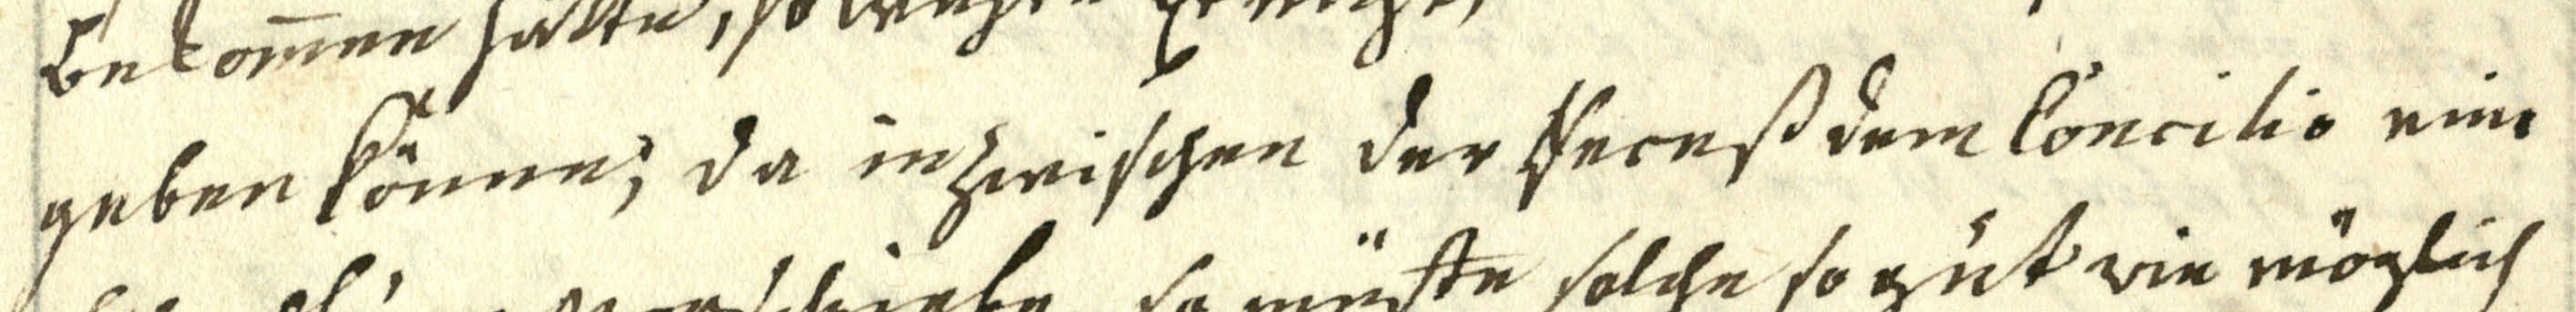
geben könne, da inzwischen der Receß dem Concilio eine
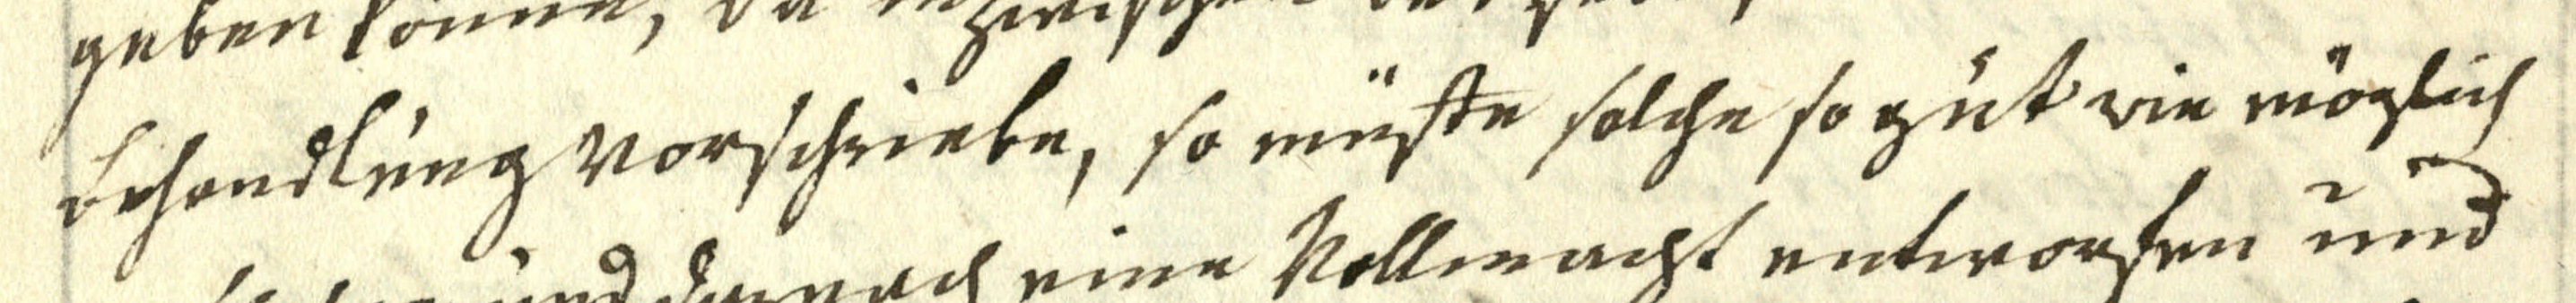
Behandlung vorschriebe, so müste solche so gut wie möglich
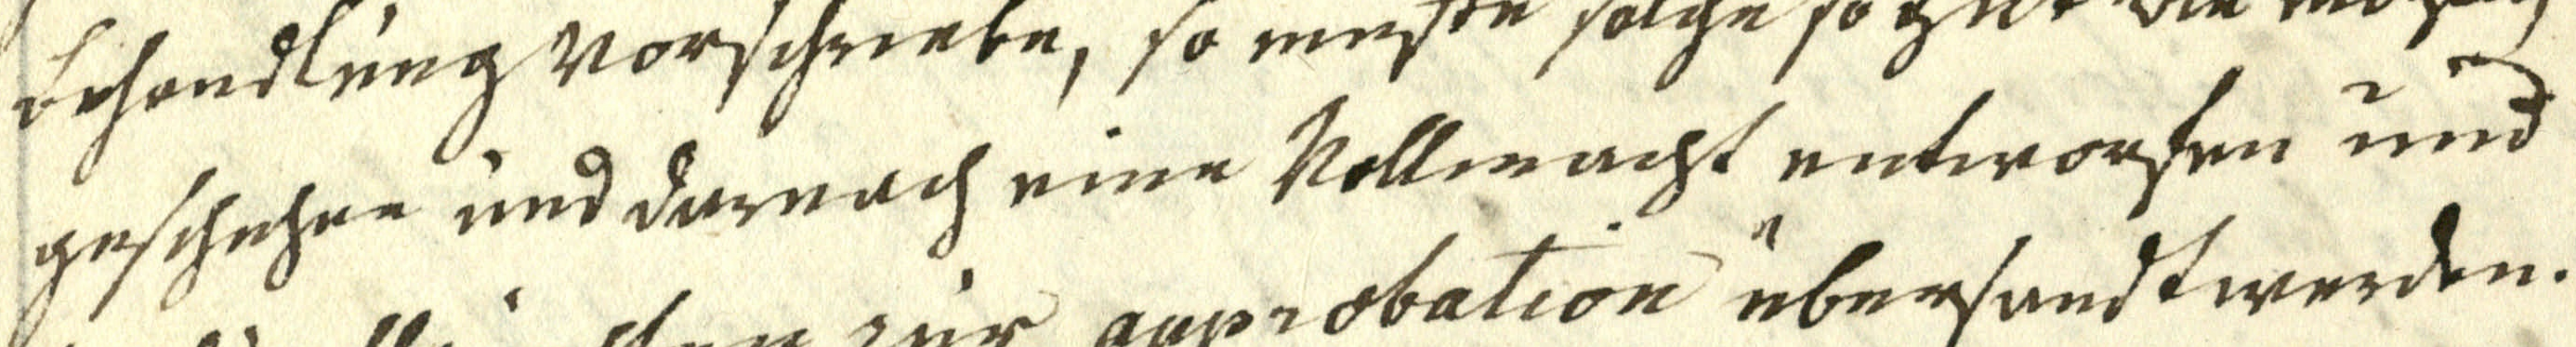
geschehen und darnach eine Vollmacht entworfen und
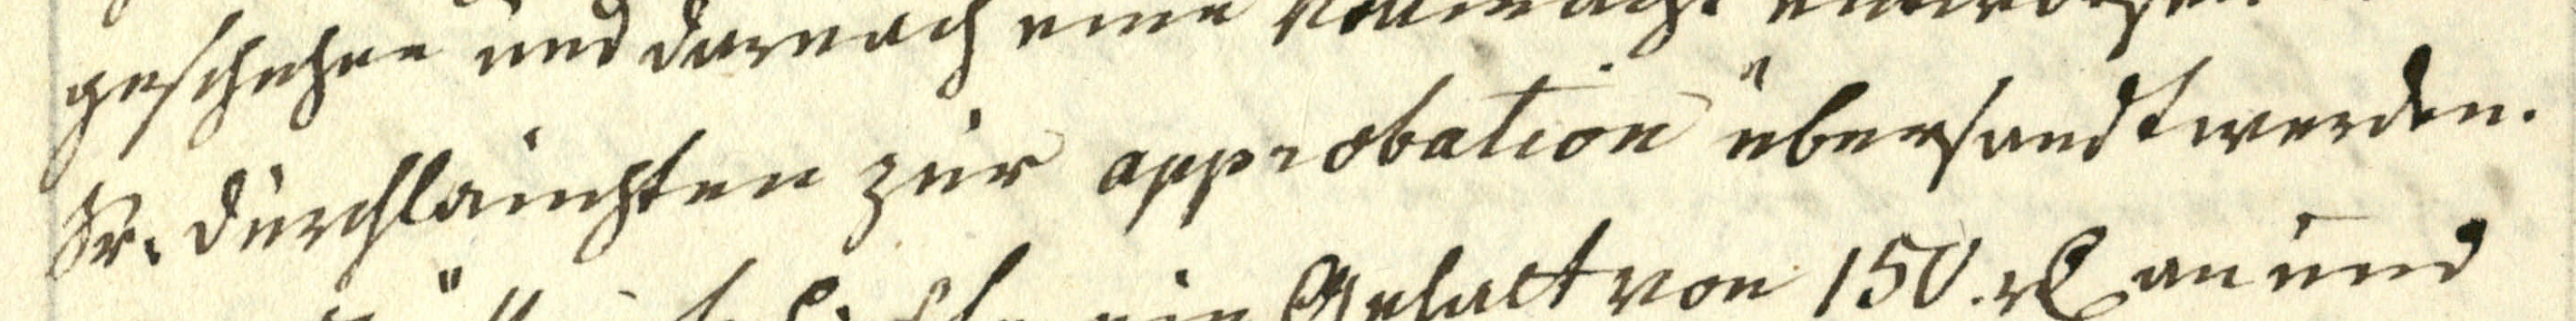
Sr. Durchlauchten zur approbation übersandt werden.
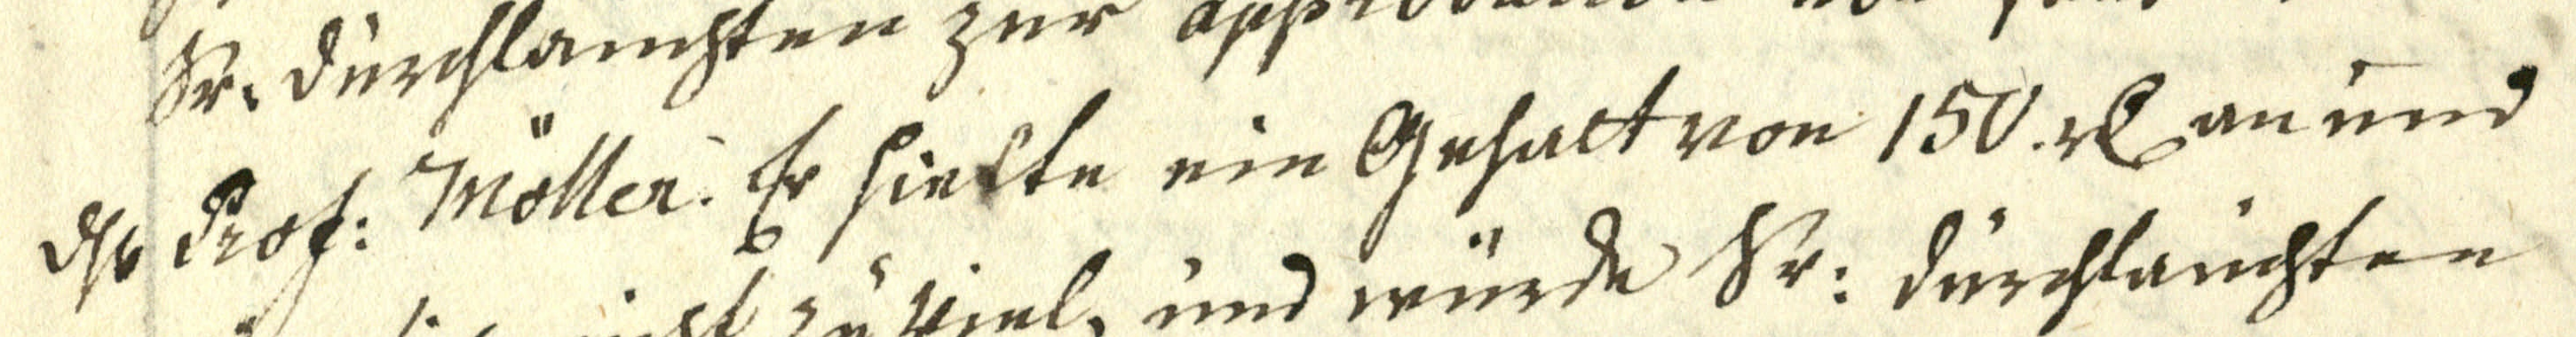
dh Prof. Möller. Er hielte ein Gehalt von 150 r an und
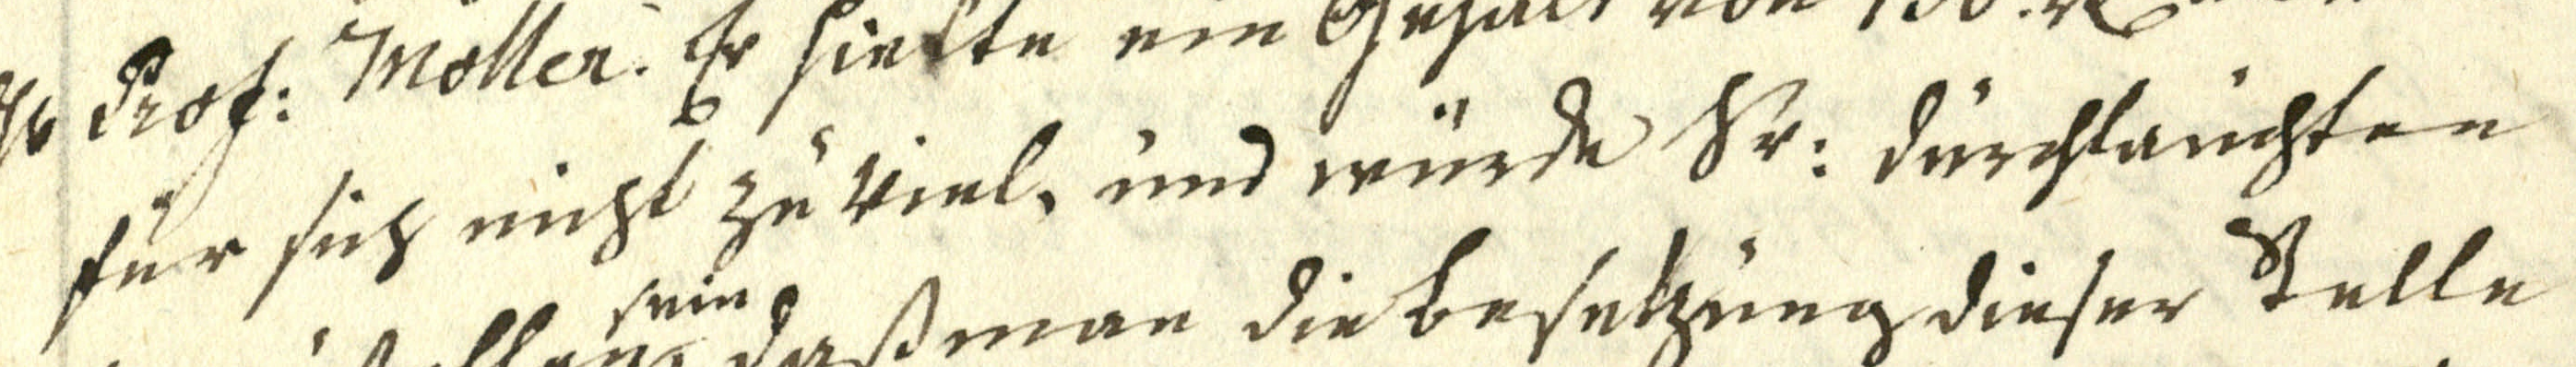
für sich nicht zu viel, und würde Sr. Durchlauchten
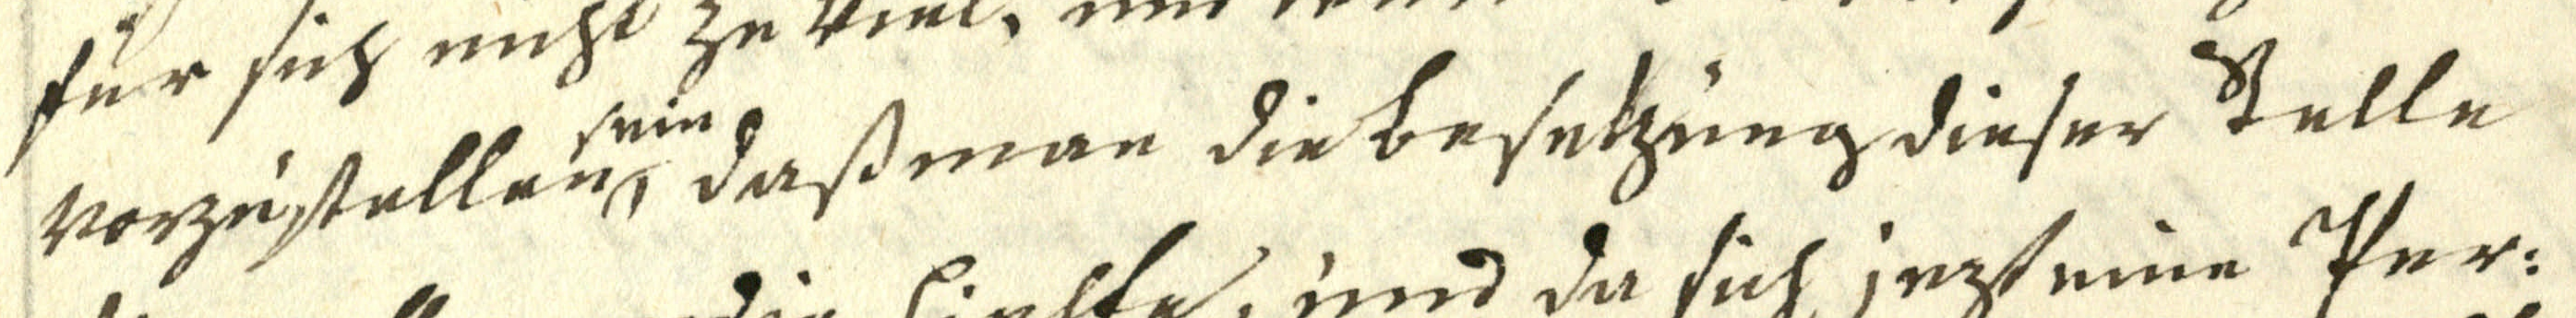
vorzustellen sein, daß man die Besetzung dieser Stelle
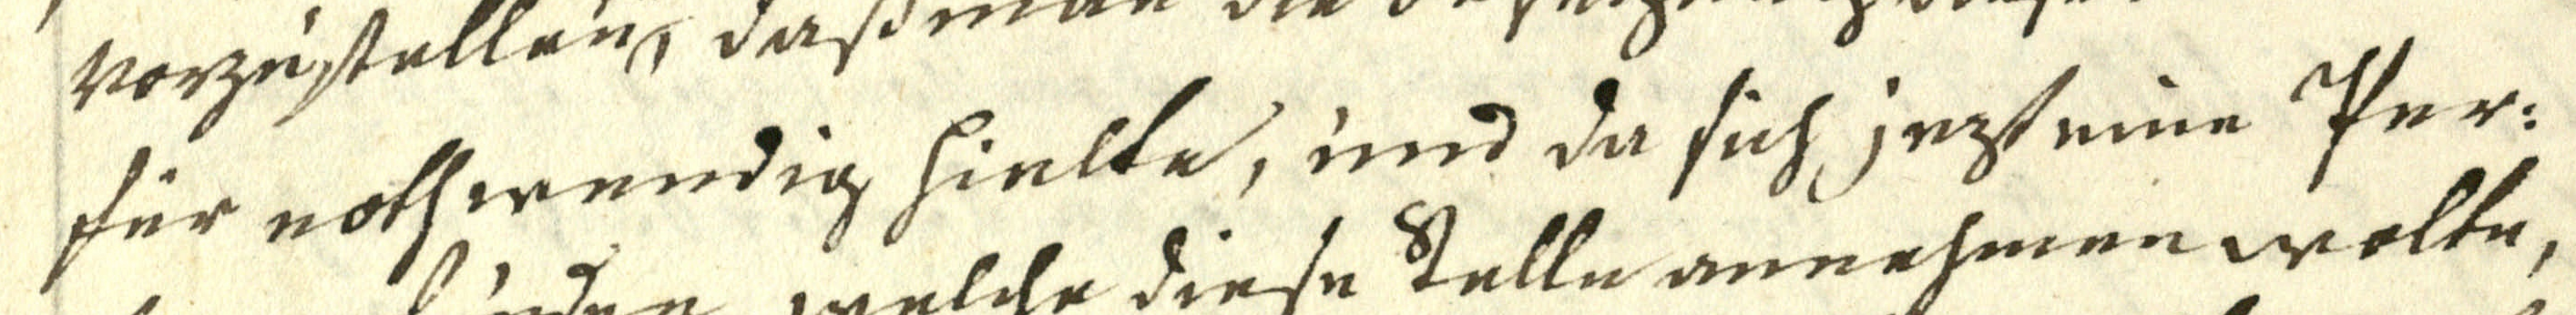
für nothwendig hielte, und da sich jezt eine Per¬
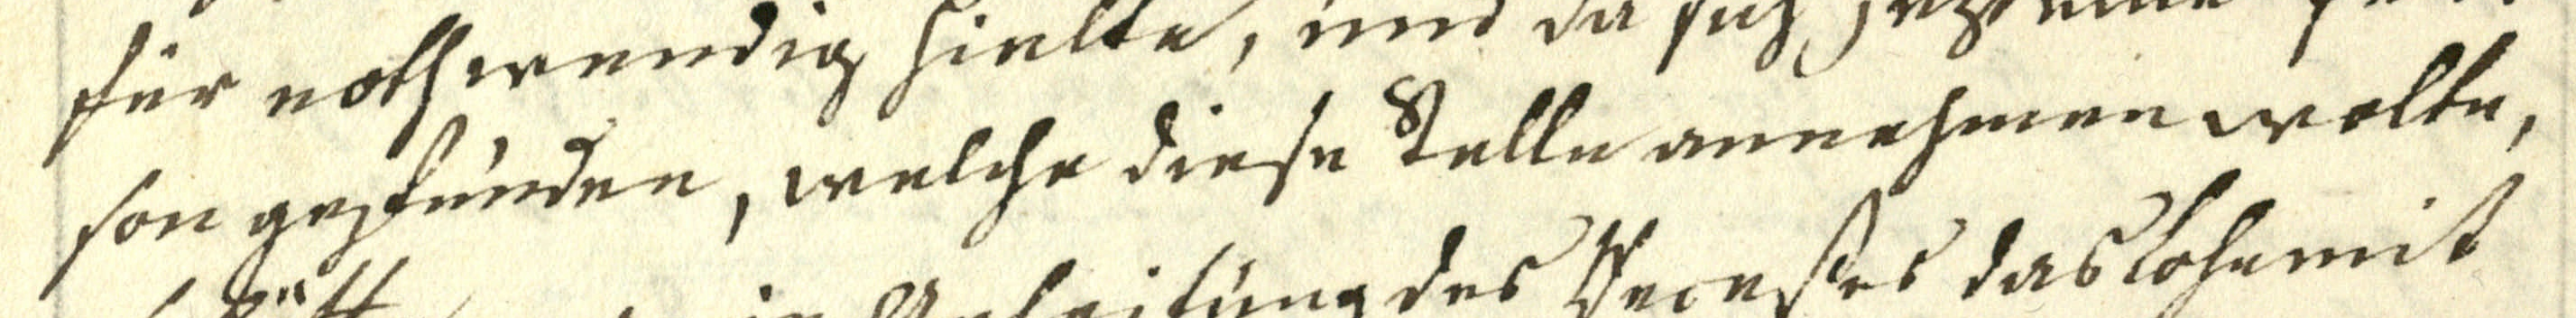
son gefunden, welche diese Stelle annehmen wolte,
